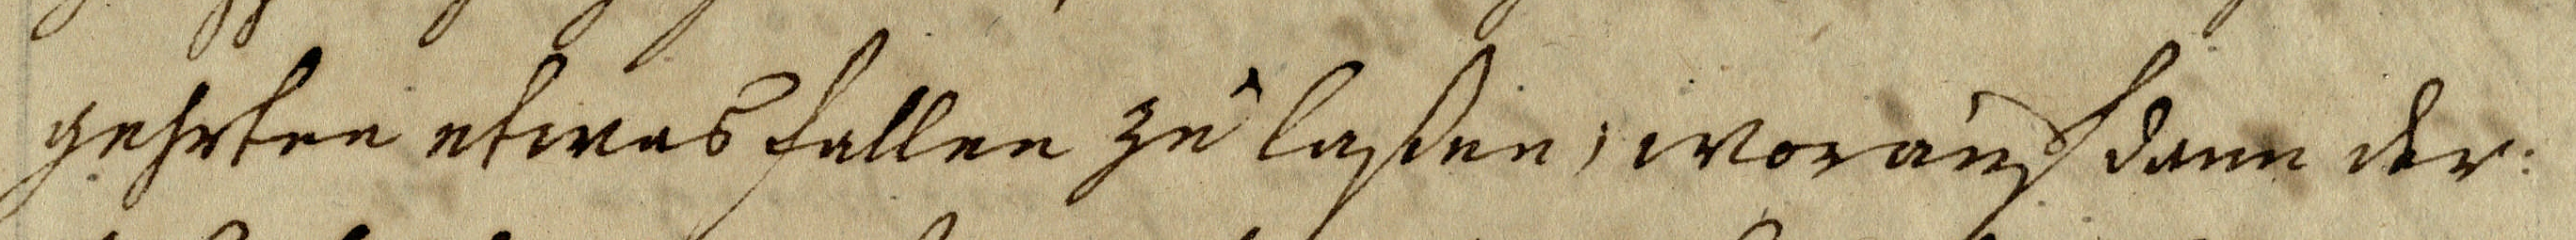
gehrten etwas fallen zu lassen, worauf dann der¬
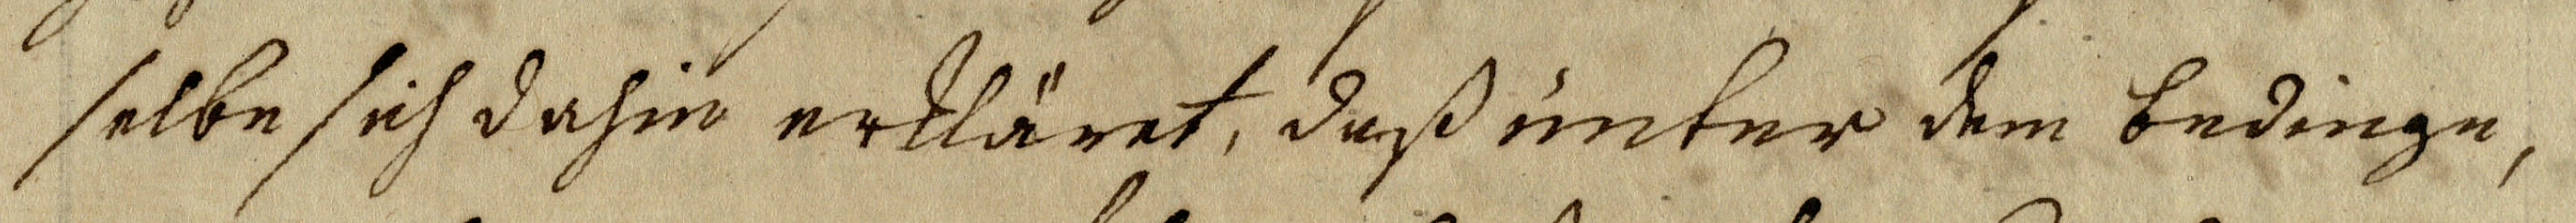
selbe sich dahin erkläret, daß unter dem Bedinge,
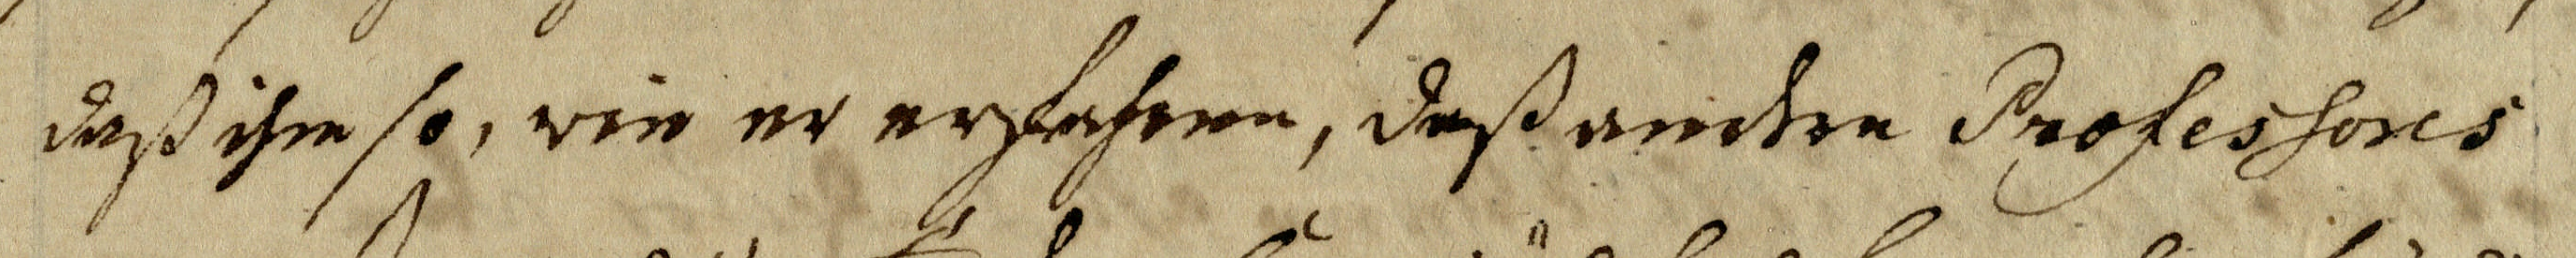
daß ihm so, wie er erfahren, daß andere Professores
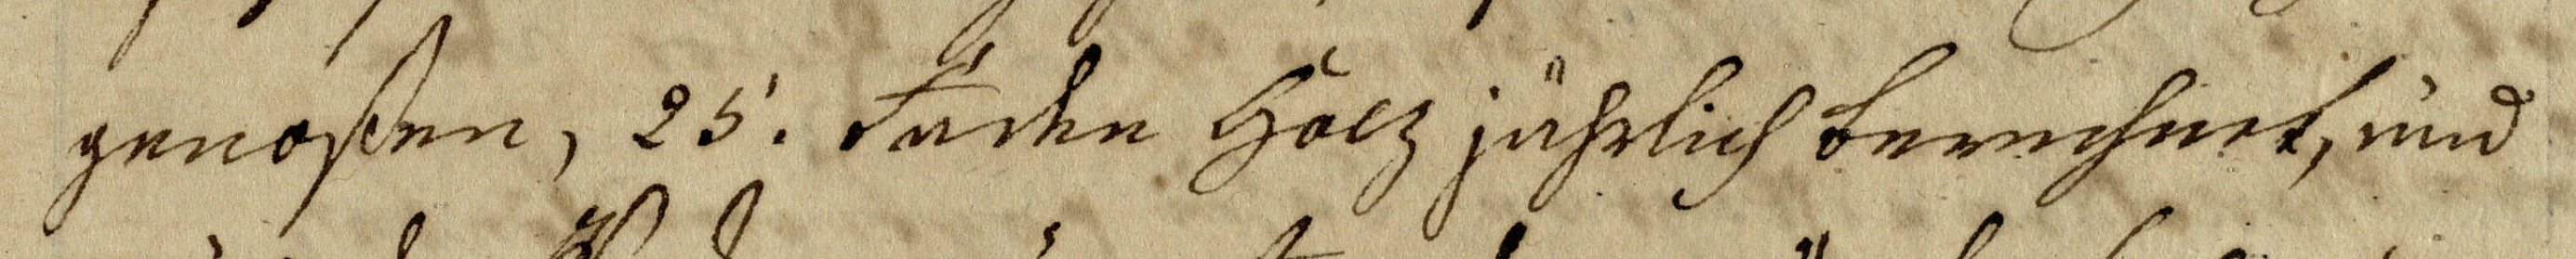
genoßen, 25. Faden Holz jährlich berechnet, und
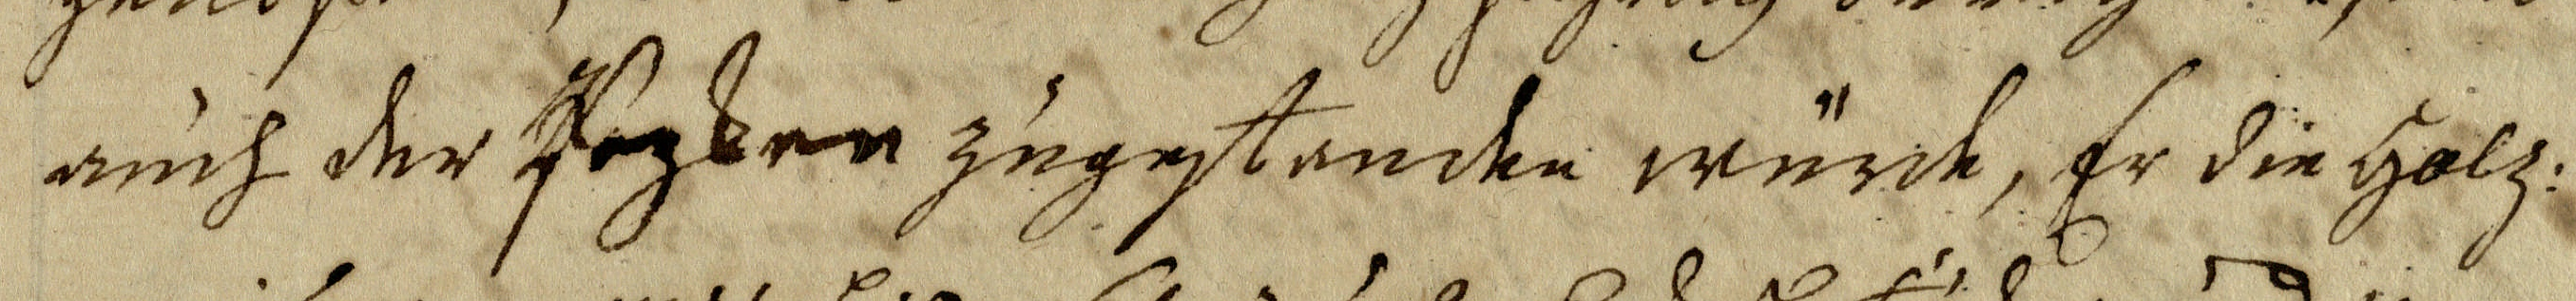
auch der Rogken zugestanden würde, Er die Holz¬
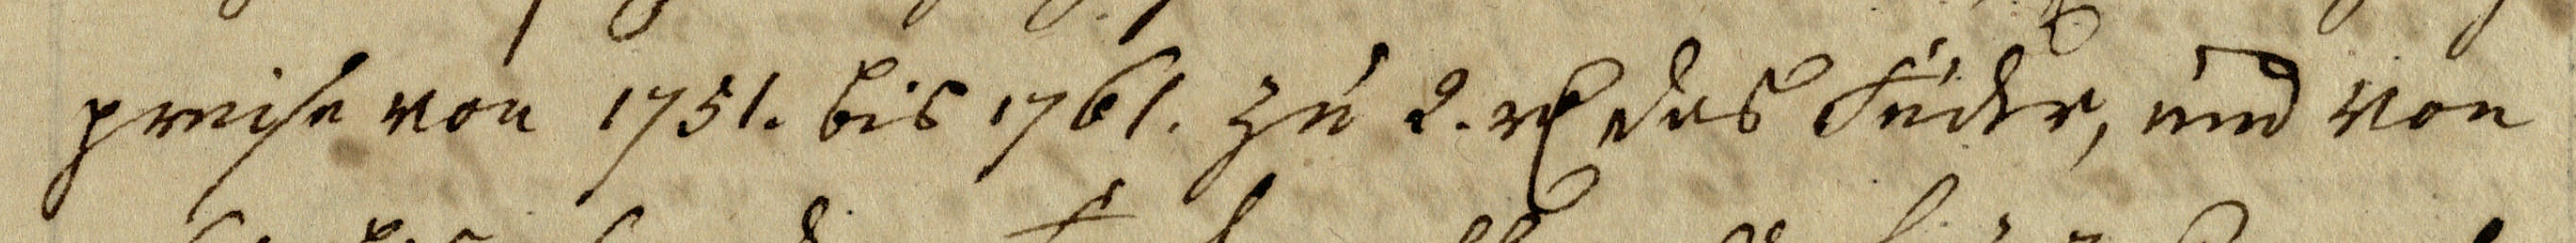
preis von 1751. bis 1761. zu 2. rt das Fuder, und von
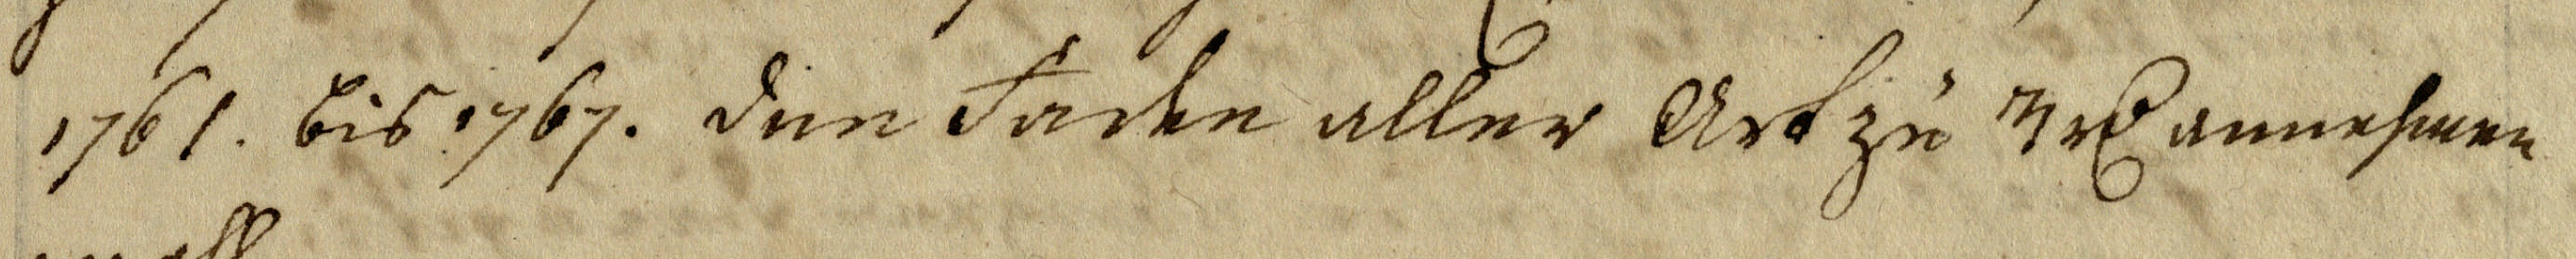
1761. bis 1767. den Faden aller Art zu 3rt annehmen
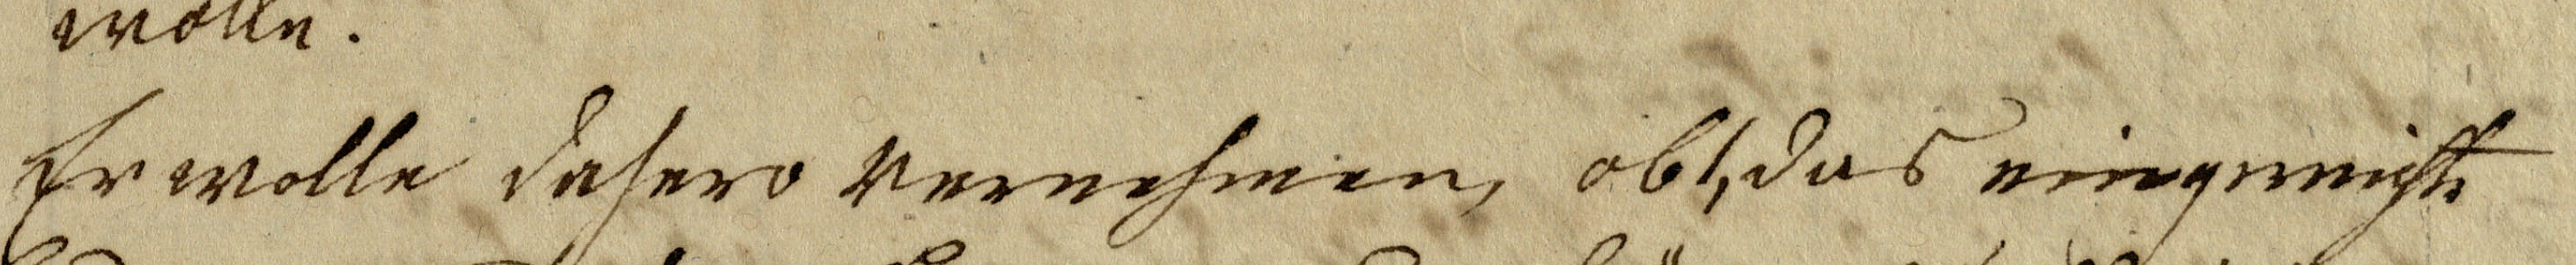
Er wolle dahero vernehmen, ob 1, das eingereichte
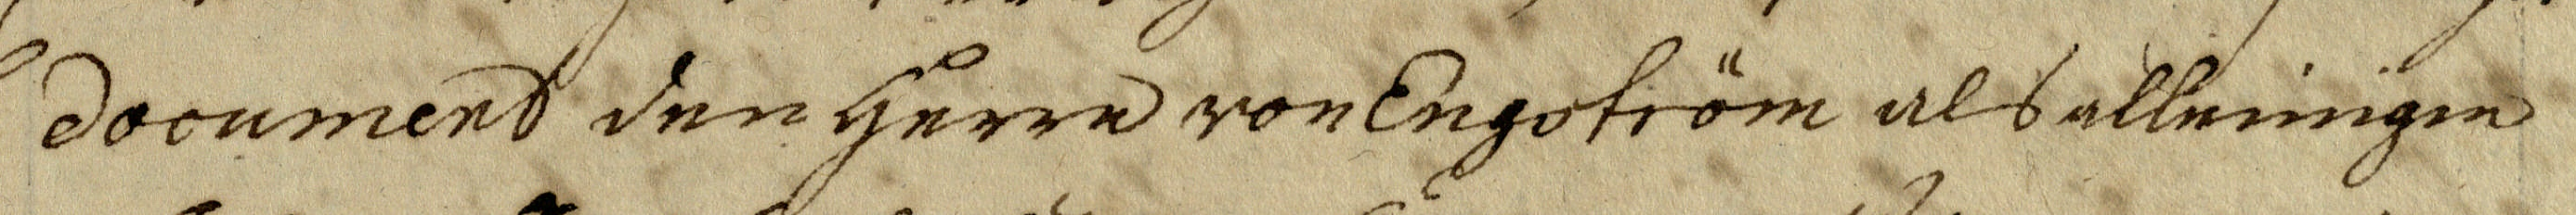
document den Herrn von Engström als alleinigen
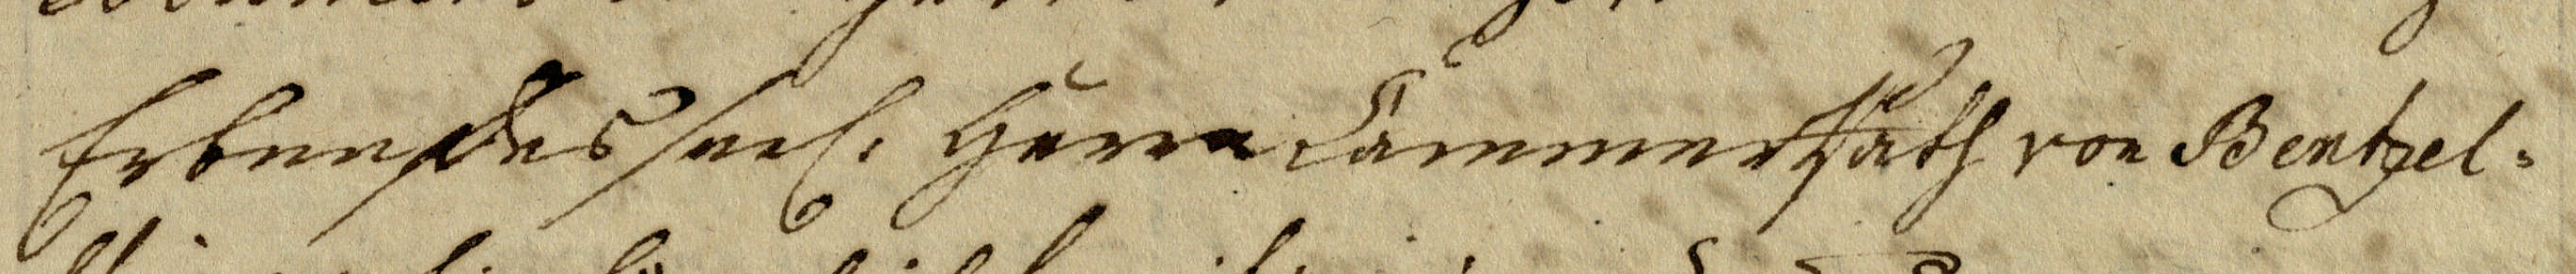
Erben des seel. Herrn CammerRath von Bentzel¬
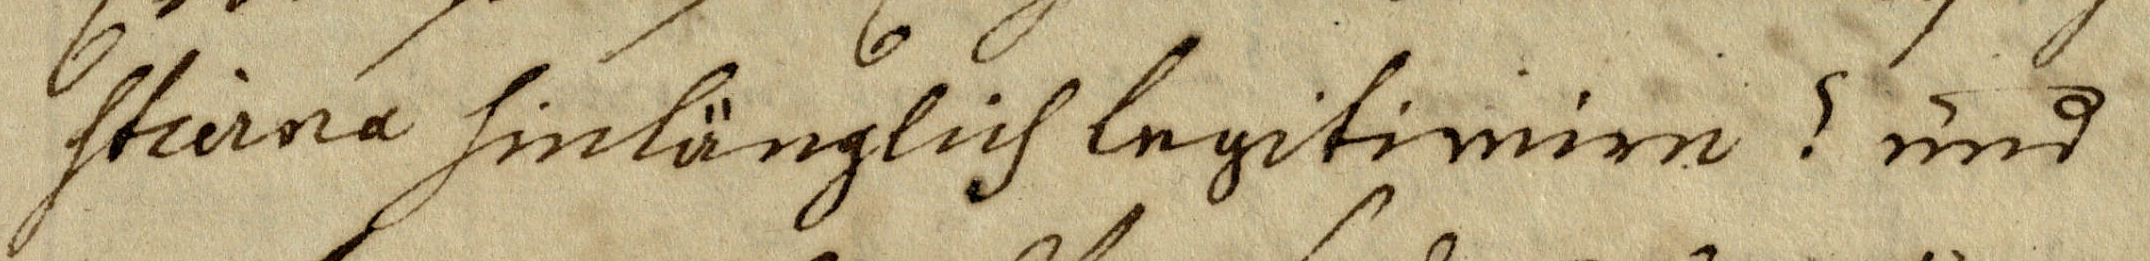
stierna hinlänglich legitimire? und
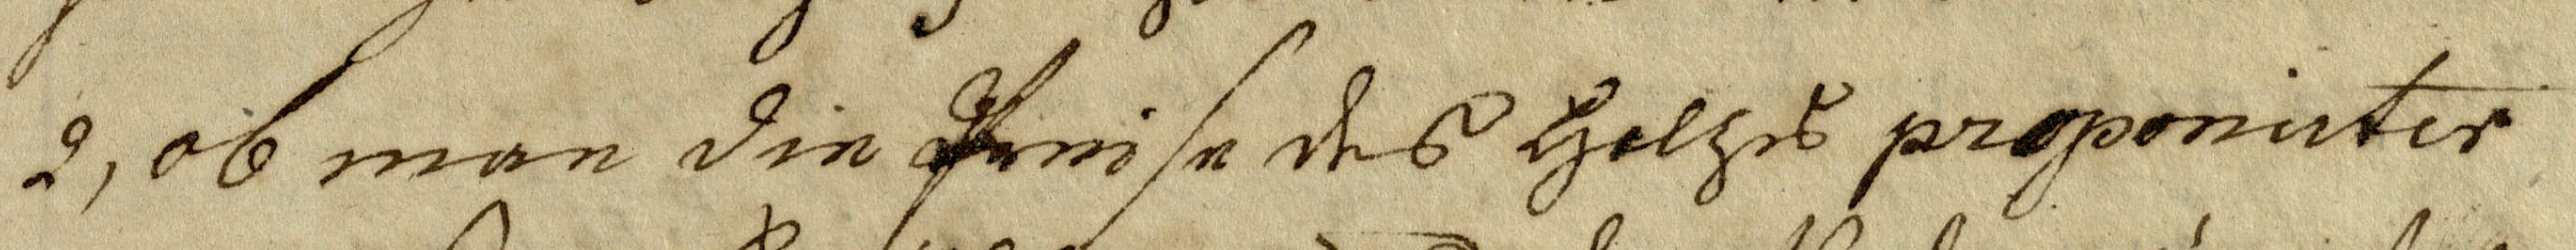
2, ob man die Preise des Holzes proponirter
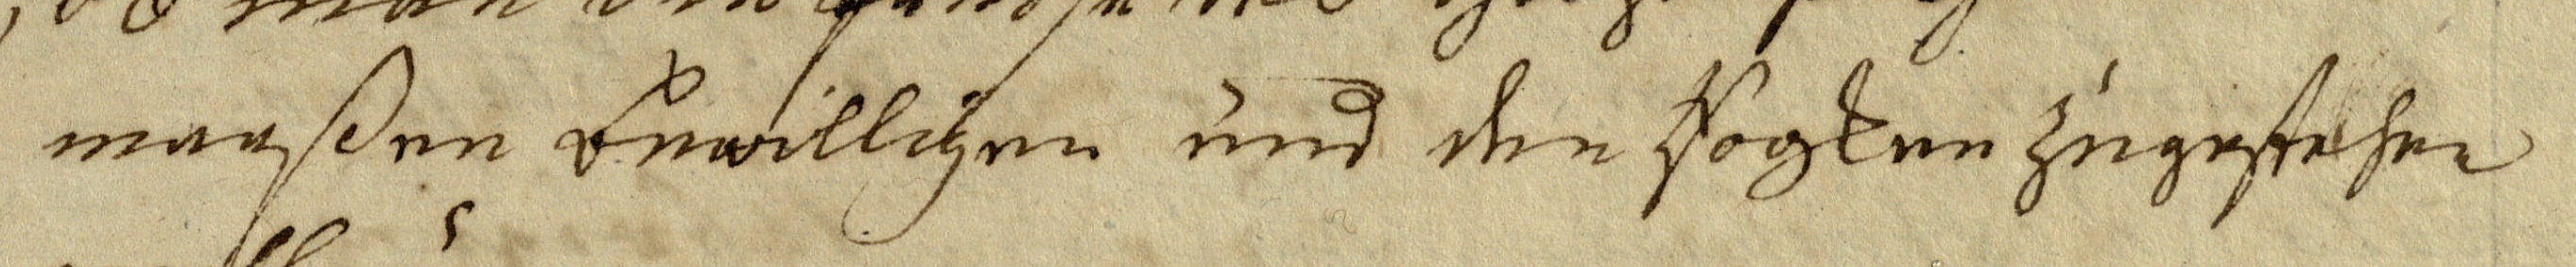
maaßen bewilligen und den Rogken zugestehen
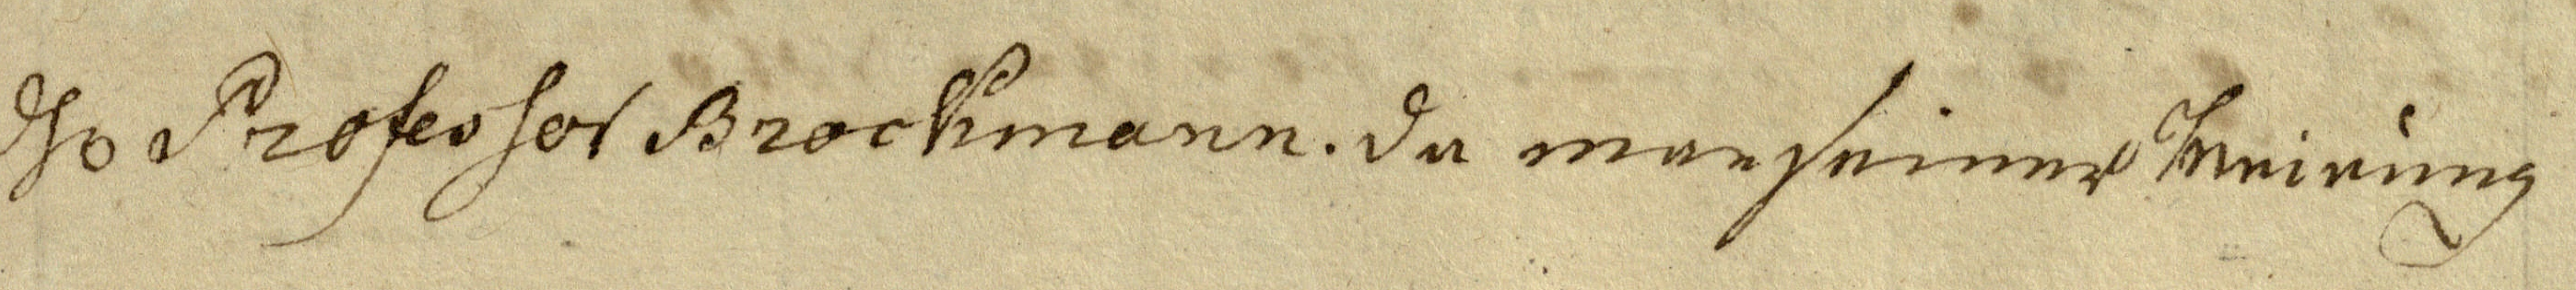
dh Professor Brockmann. Da man seiner Meinung
